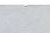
dans le
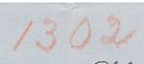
Royaume
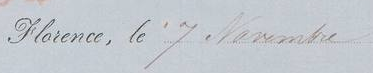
Florence, le '7 Novembre
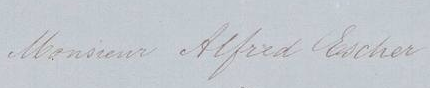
Monsieur Alfred Escher
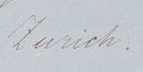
Zurich.
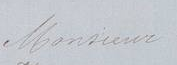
Monsieur.
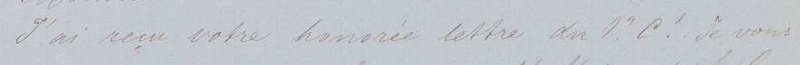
J'ai reçu votre honorée lettre du 1r Ct. Je vous
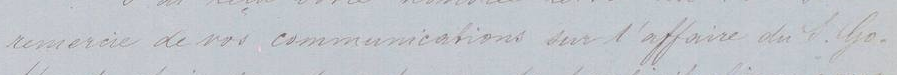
remercie de vos communications sur l'affaire du S. Go-
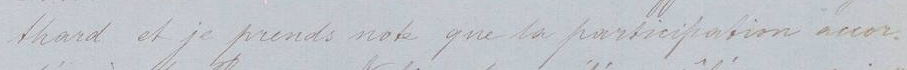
thard et je prends note que la participation accor-
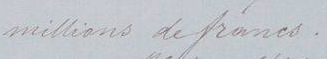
millions de francs.
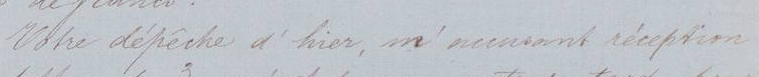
Votre dépêche d'hier, m'accusant réception
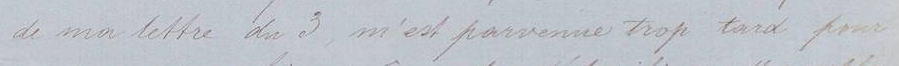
de ma lettre du 3, m'est parvenue trop tard pour
